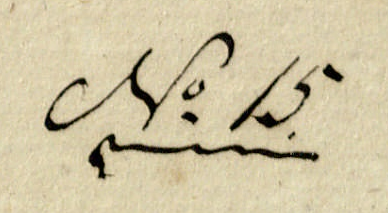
No 15.
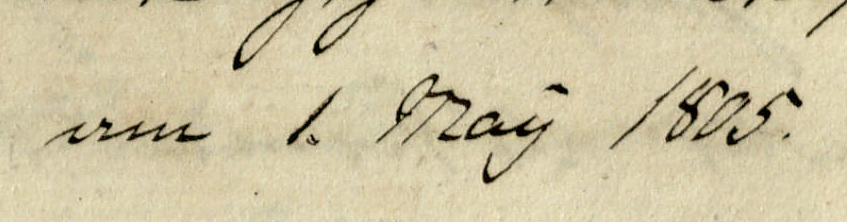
am 1. Maÿ 1805.
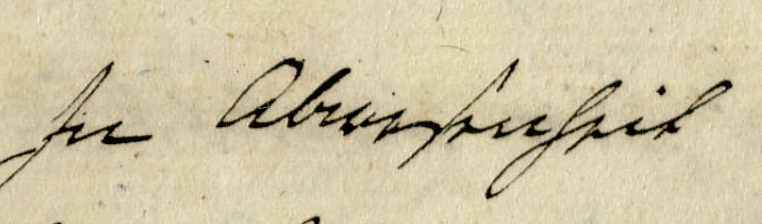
In Abwesenheit
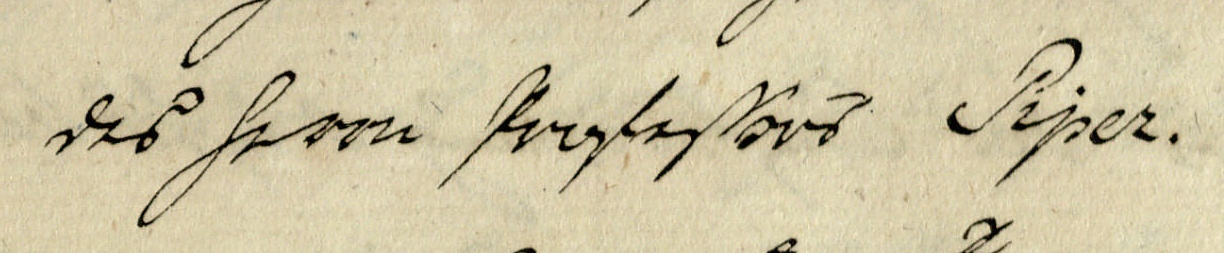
des Herrn Professors Piper.
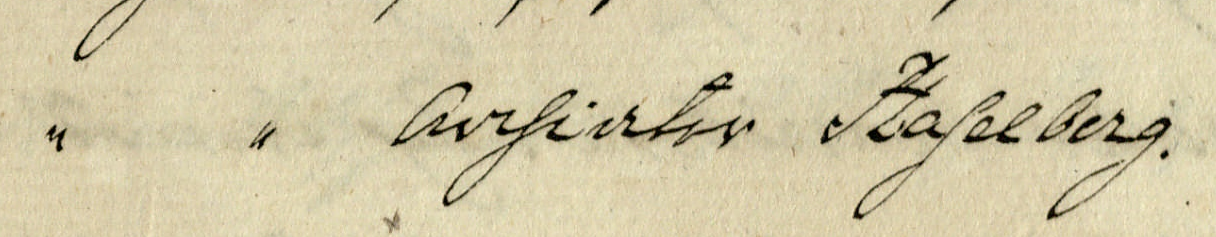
Archiater Haselberg.
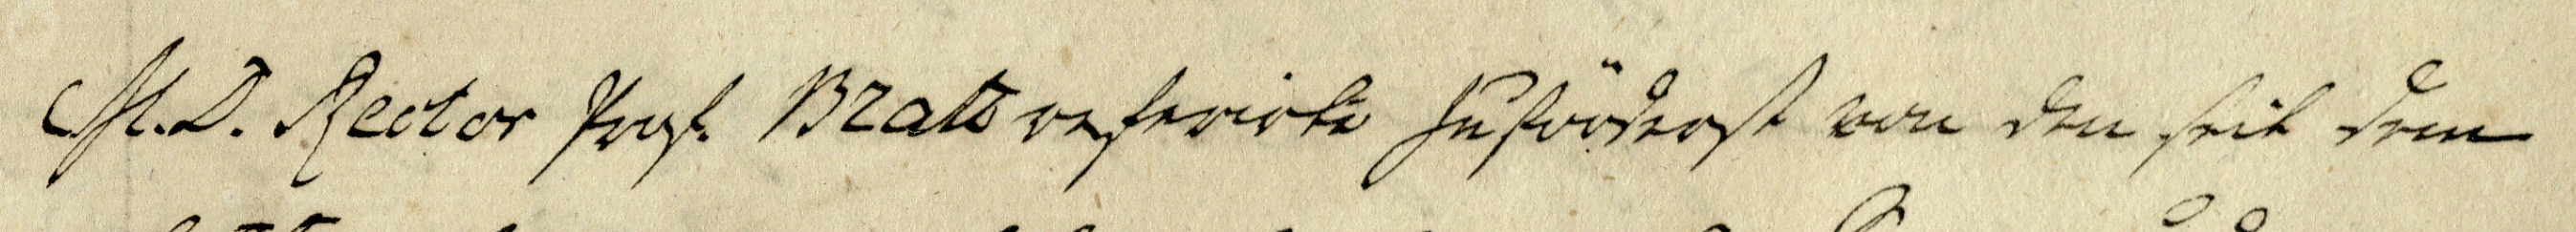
M. D. Rector Prof. Bratt referirte zuförderst von den seit dem
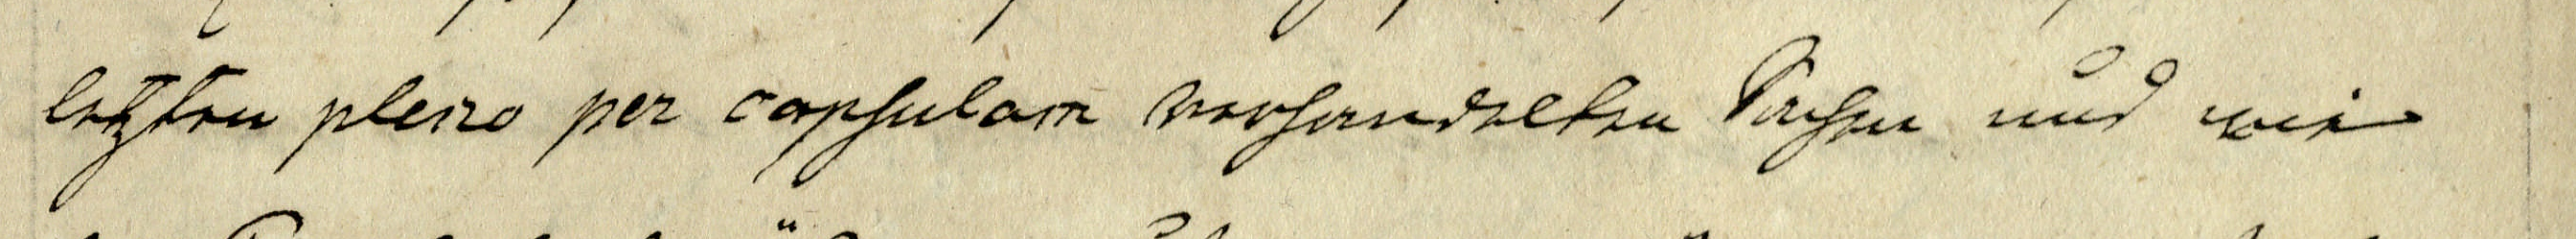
letzten pleno per capsulam verhandelten Sachen und wie
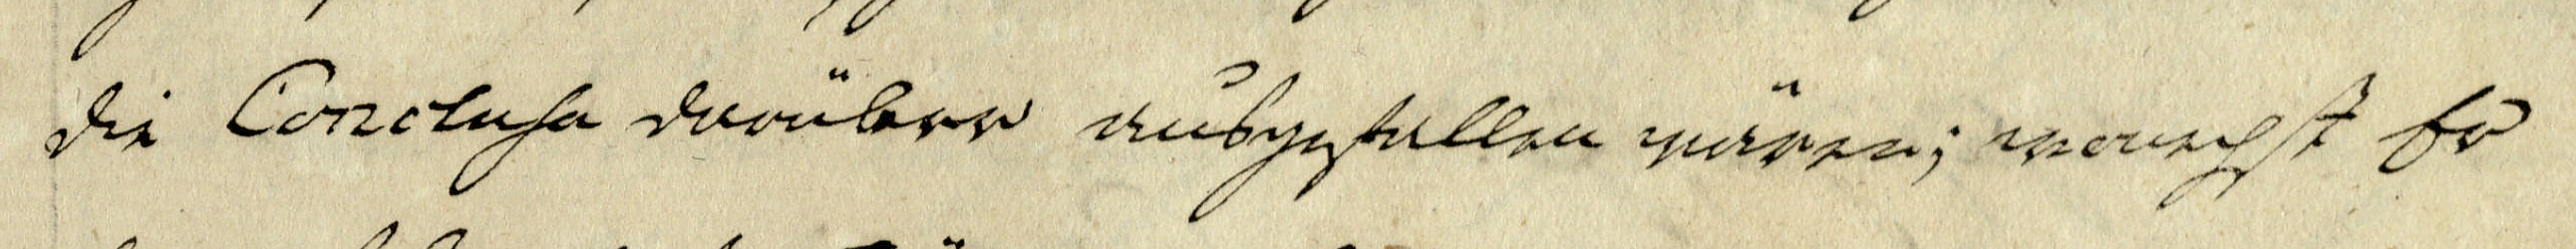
die Conclusa darüber ausgefallen wären; wonechst Er
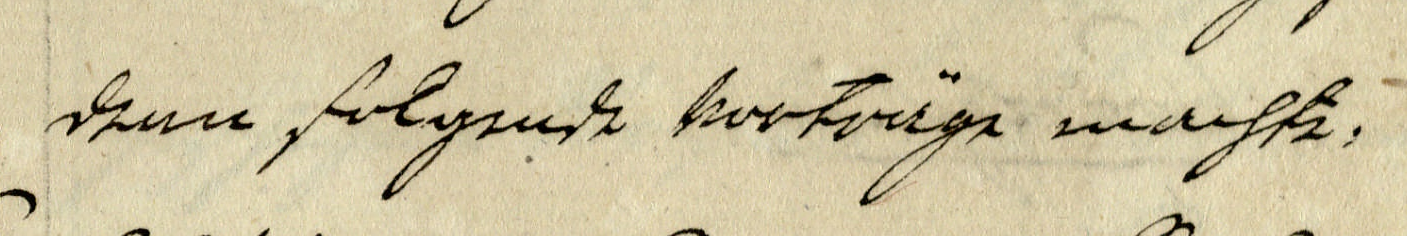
denn folgende Vorträge machte:
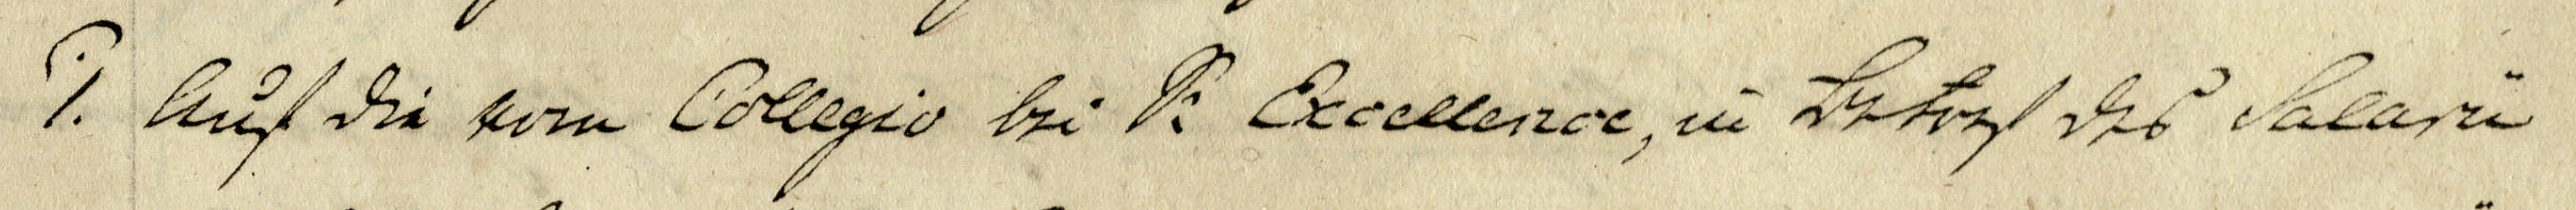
1. Auf die vom Collegio bei Sr Excellence, in Betref des Salarii
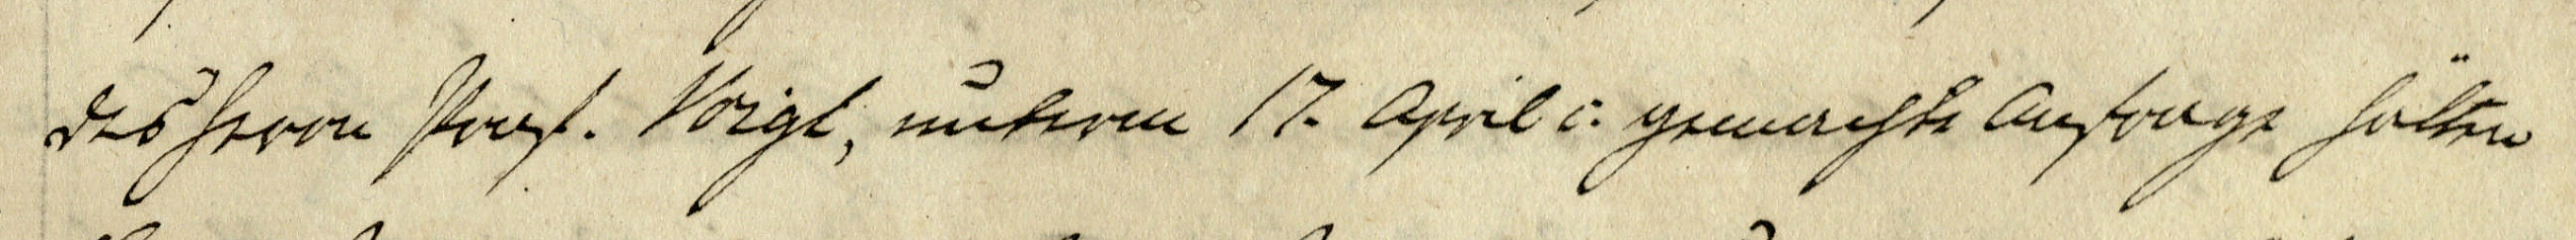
des Herrn Prof. Voigt, unterm 17. April c. gemachte Anfrage hätten
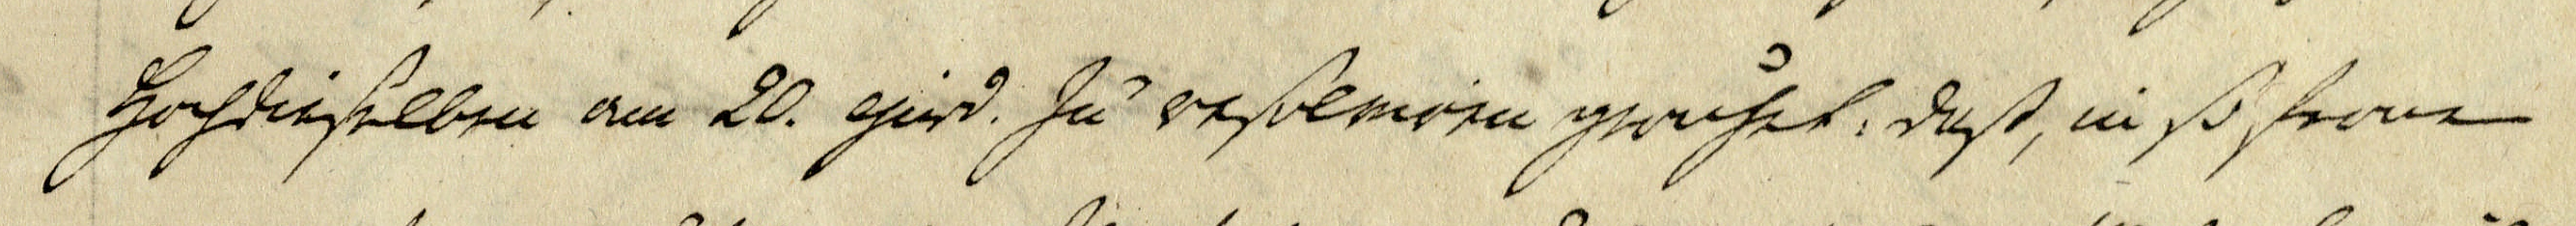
Hochdieselben am 20. ejusd. zu resolviren geruhet: daß, in so ferne
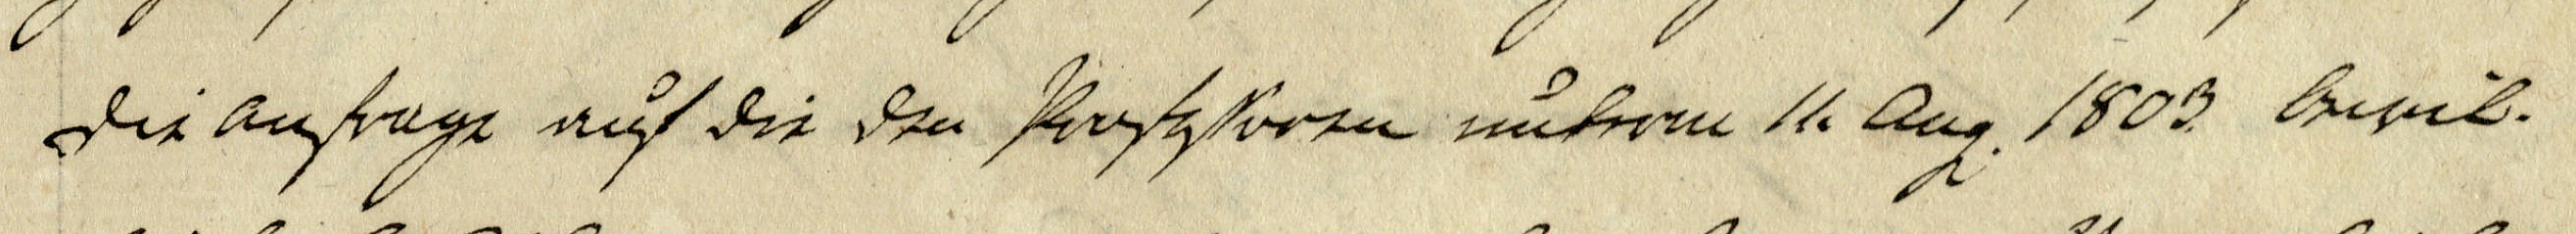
die Anfrage auf die den Professoren unterm 11. Aug. 1803 bewil¬
